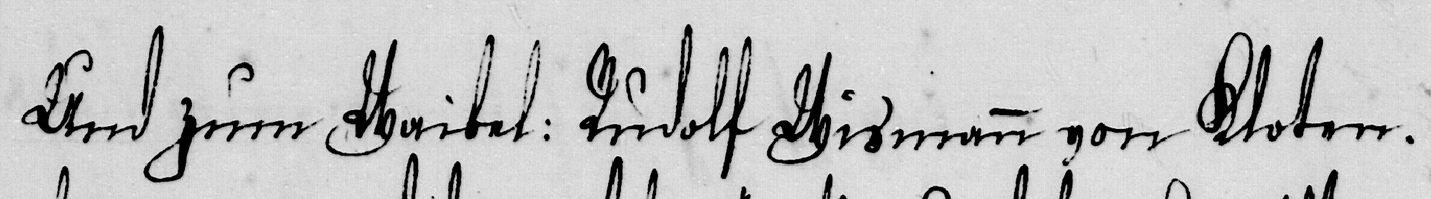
Und zum Waibel: Rudolf Wismann von Kloten.
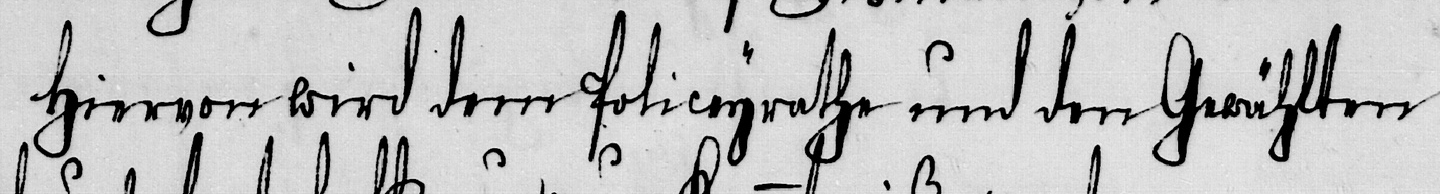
Hiervon wird dem Policeyrathe und den Gewählten
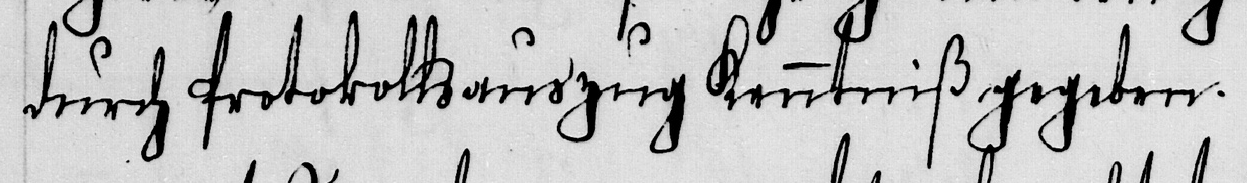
durch Protokollsauszug Kenntniß gegeben.
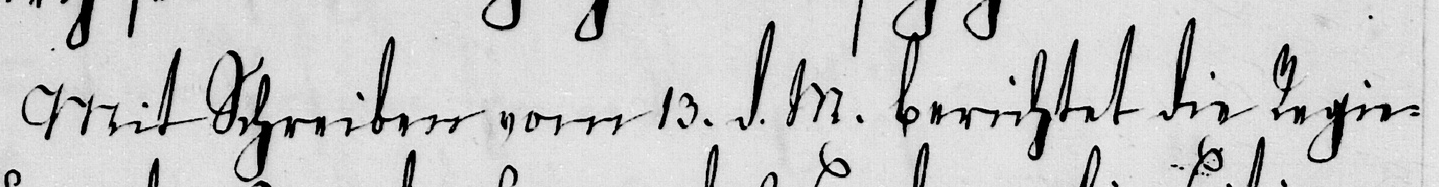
Mit Schreiben vom 13. d. M. berichtet die Regie¬
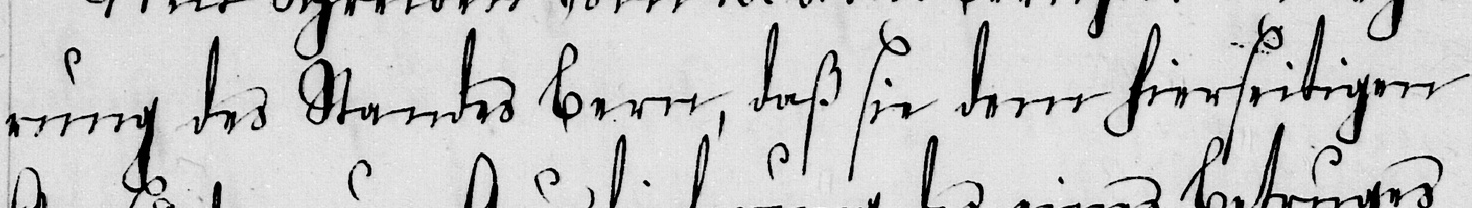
rung des Standes Bern, daß sie dem hierseitigen
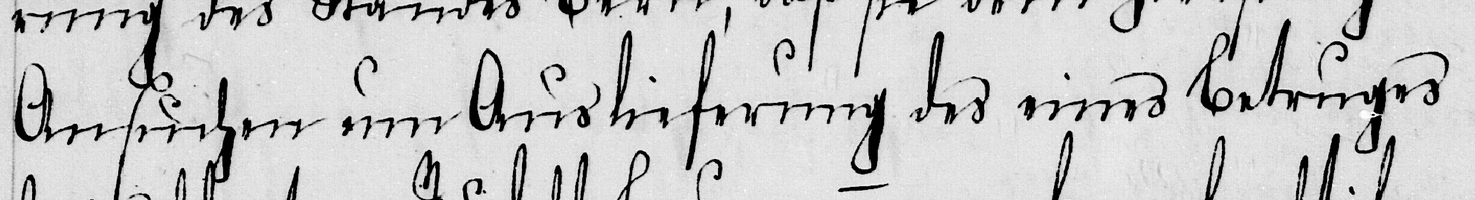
Ansuchen um Auslieferung des eines Betruges
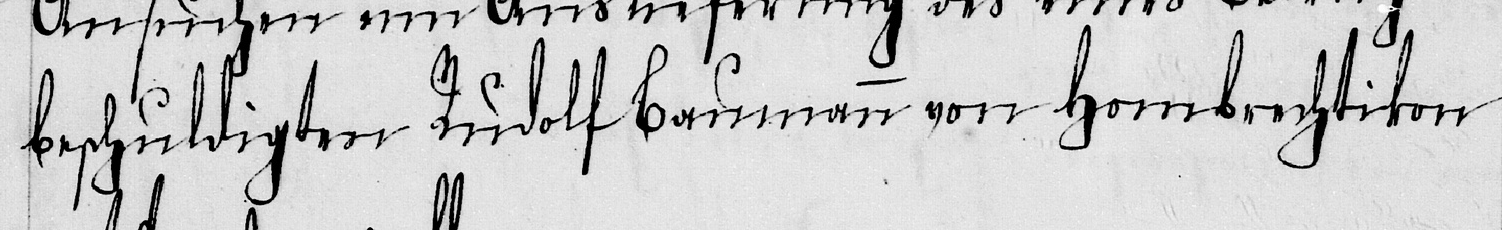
beschuldigten Rudolf Baumann von Hombrechtikon
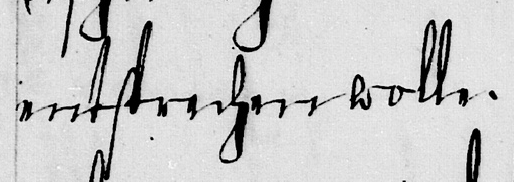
entsprechen wolle.
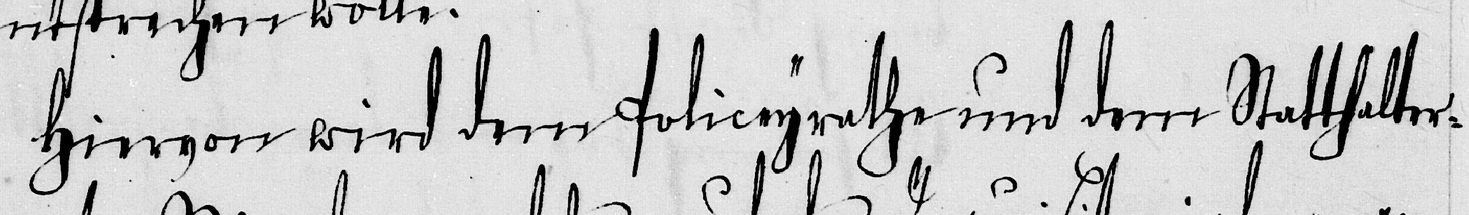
Hiervon wird dem Policeyrathe und dem Statthalt¬
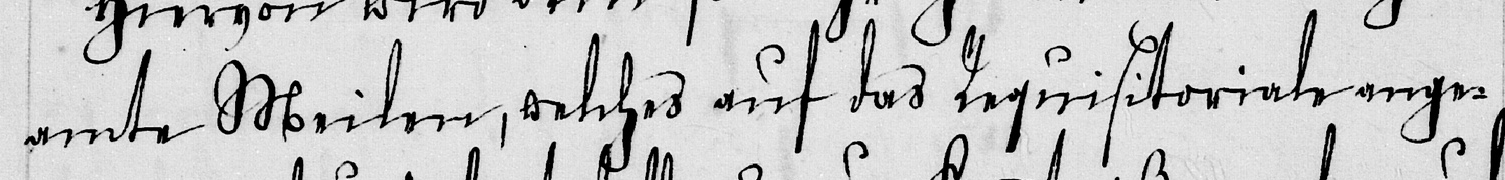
amte Meilen, welches auf das Requisitoriale ange¬
